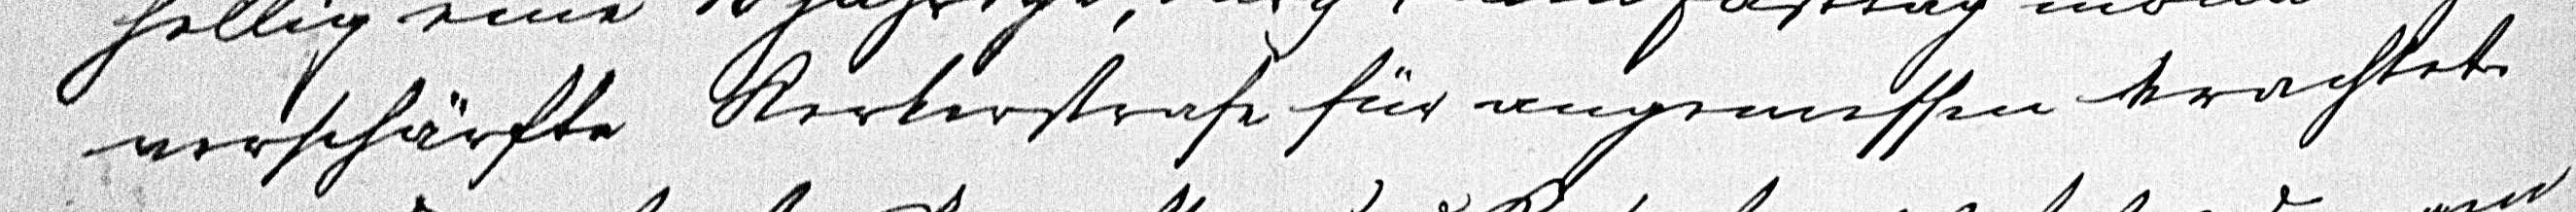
verschärfte Kerkerstrafe für angemessen trachtet.
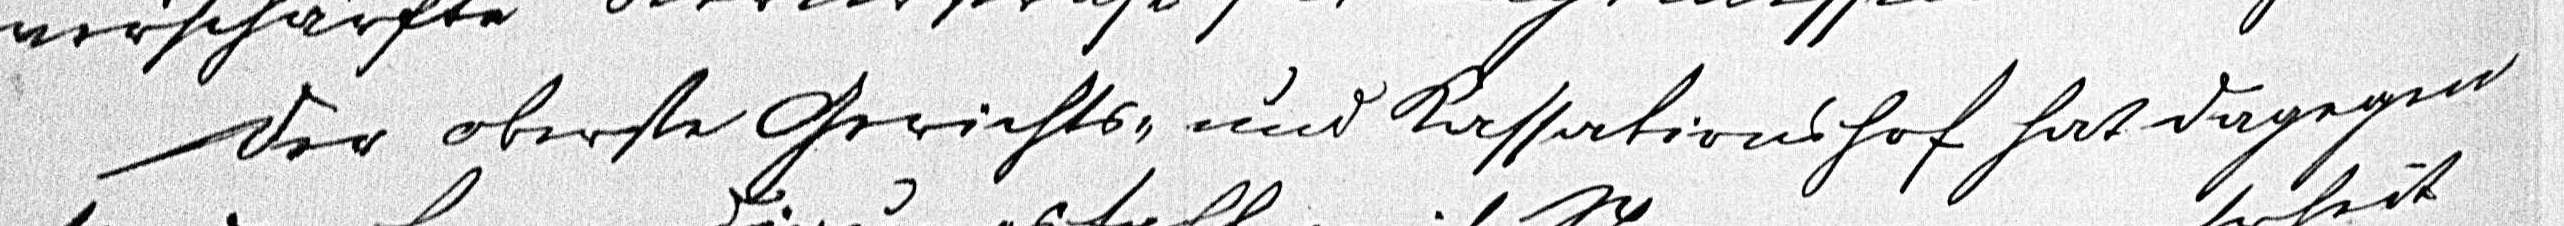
Der oberste Gerichts- und Kassationshof hat dagegen
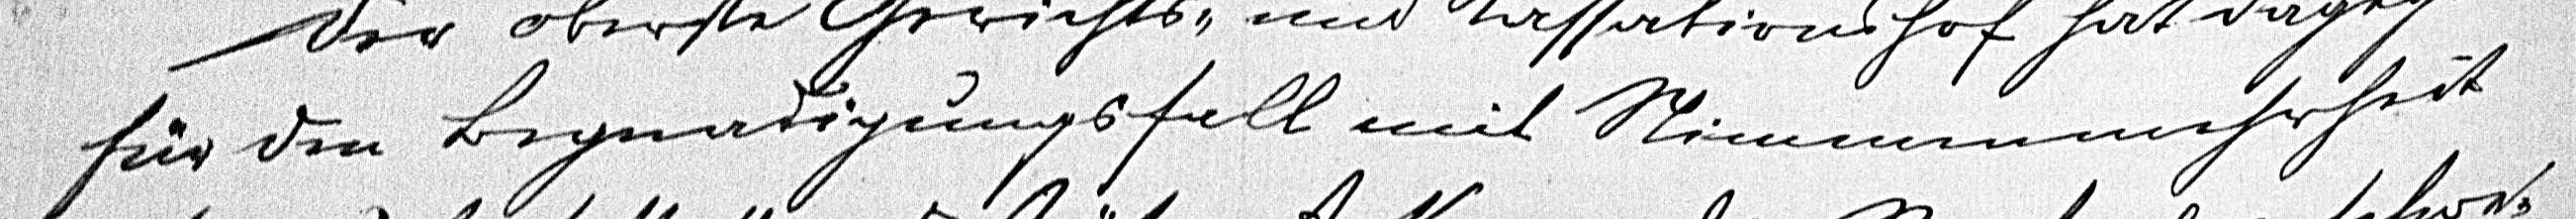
für den Begnadigungsfall mit Stimmenmehrheit
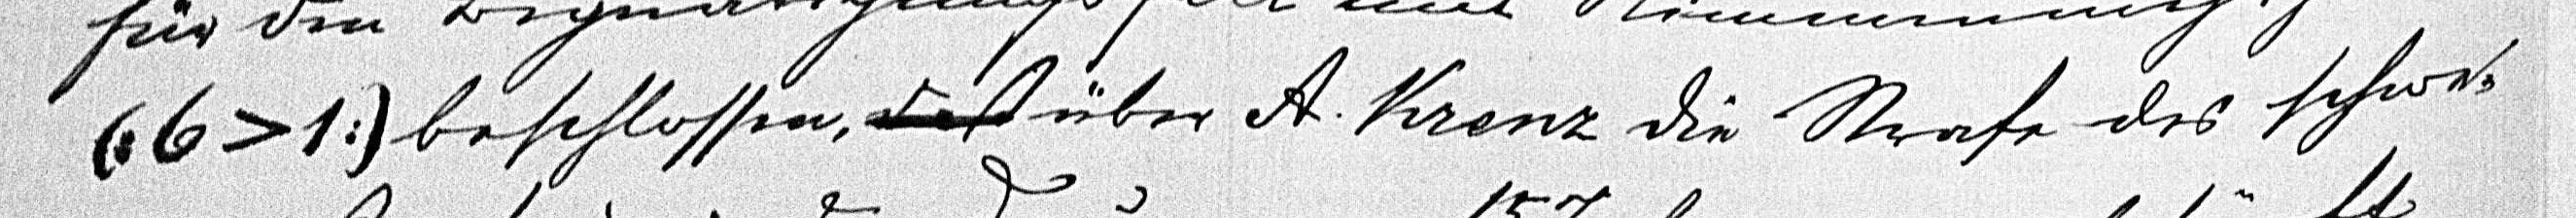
(: 6>1 :) beschlossen, über A. Krenz die Strafe des schwe¬
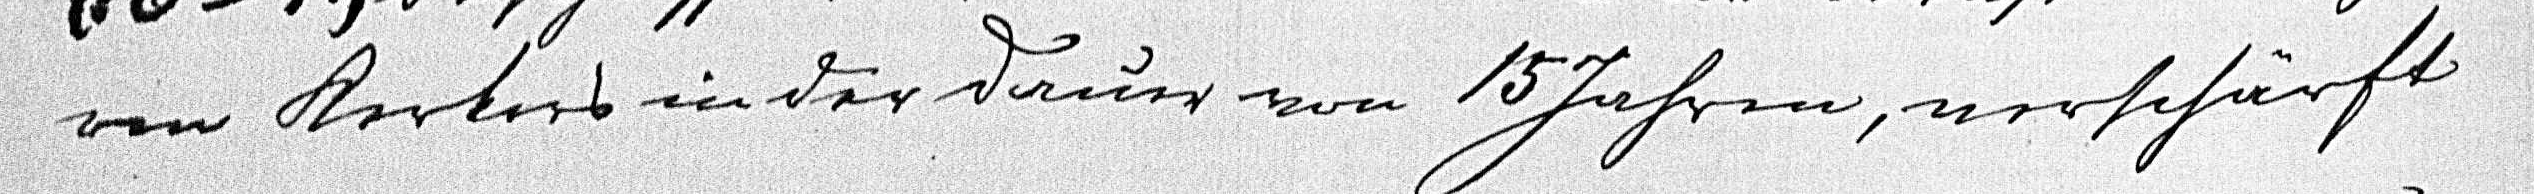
ren Kerkers in der Dauer von 15 Jahren, verschärft
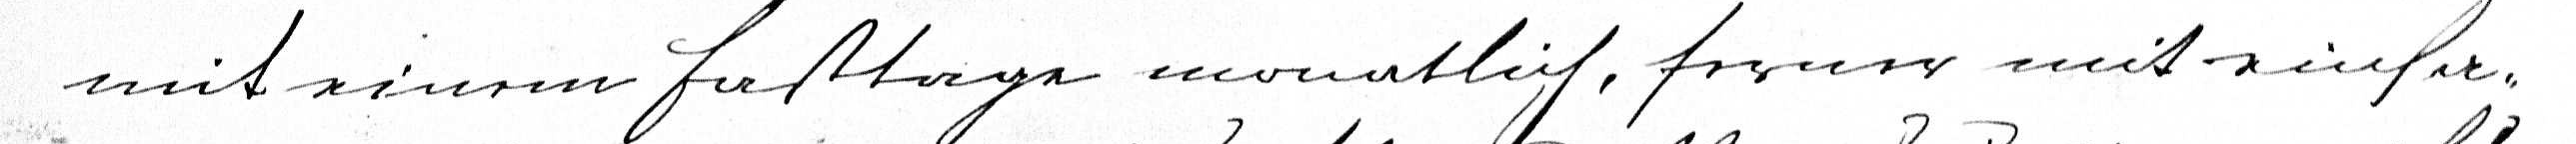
mit einem Fasttage monatlich, ferner mit einsa¬
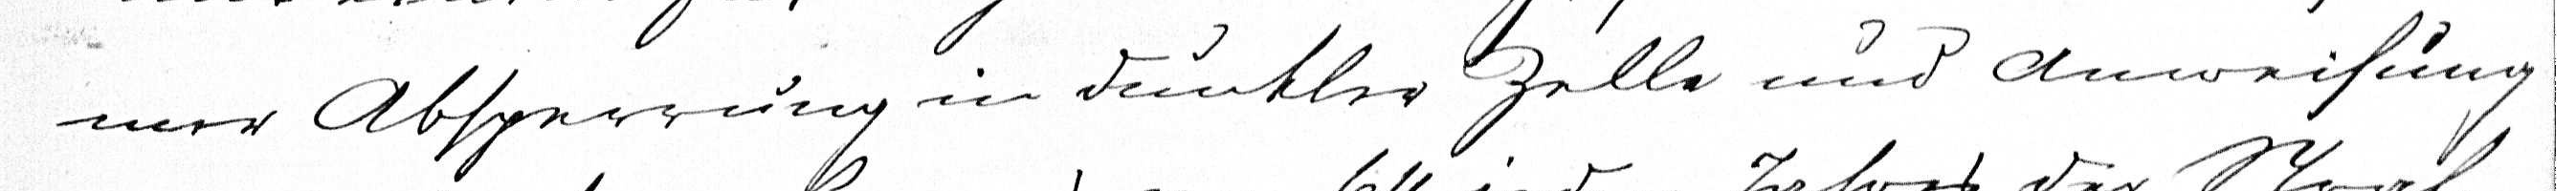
mer Absperrung in dunkler Zelle und Anweisung
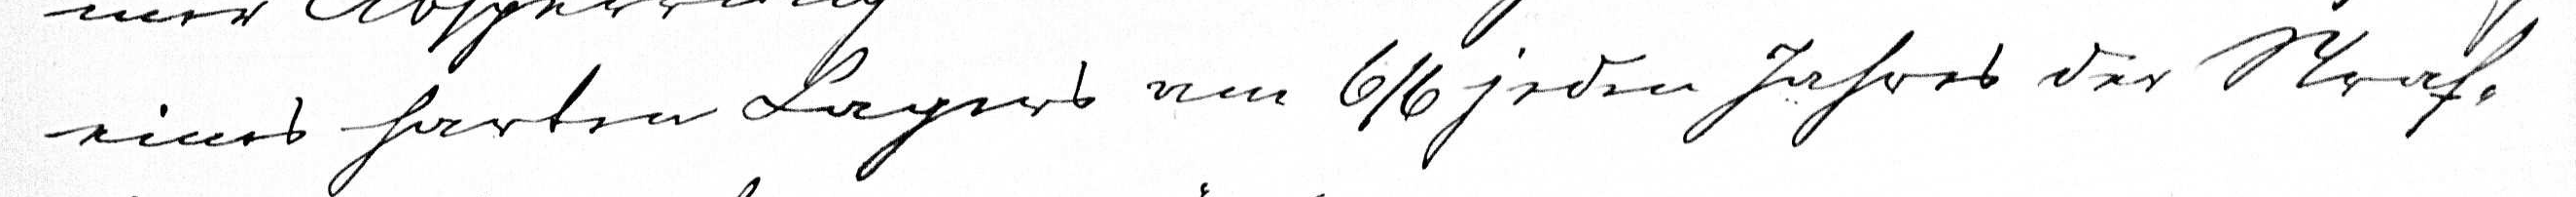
eines harten Lagers am 6/6 jeden Jahres der Straf¬
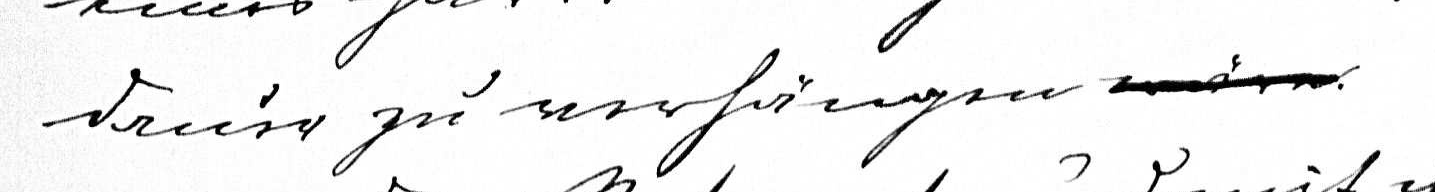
dauer zu verhängen.
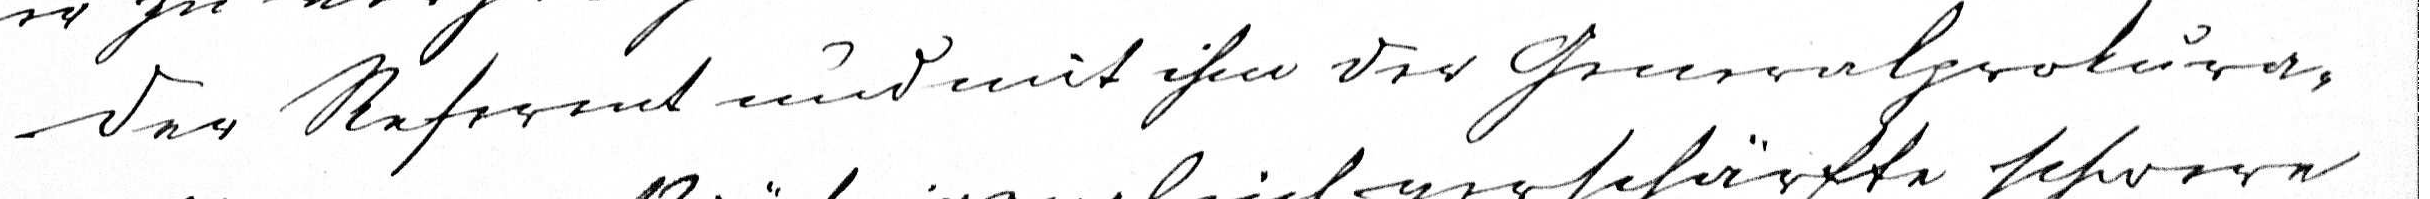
Der Referent und mit ihm der Generalprokura¬
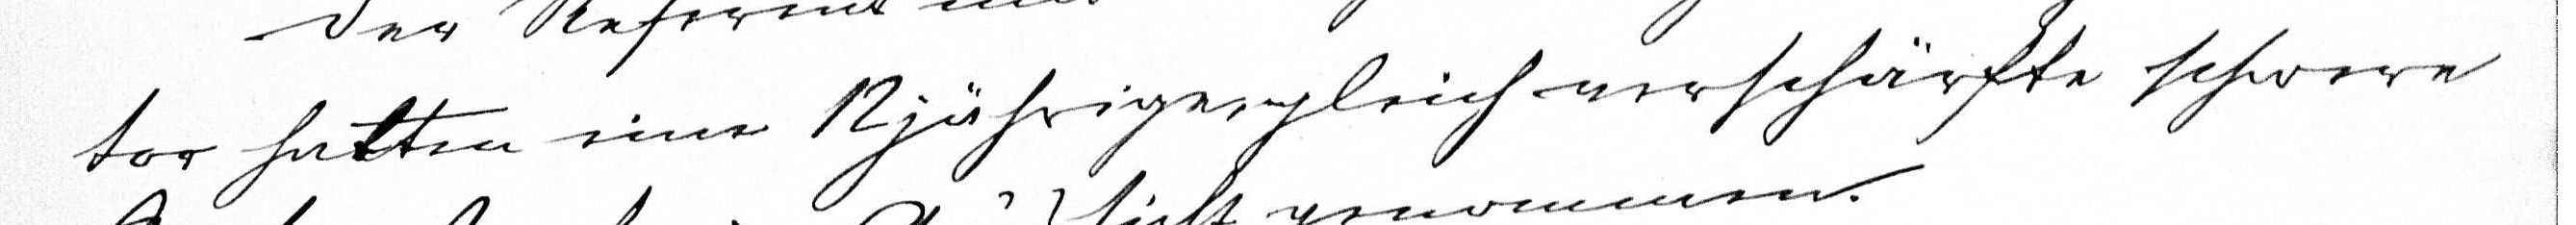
tor hatten eine 12jährige, gleich verschärfte schwere
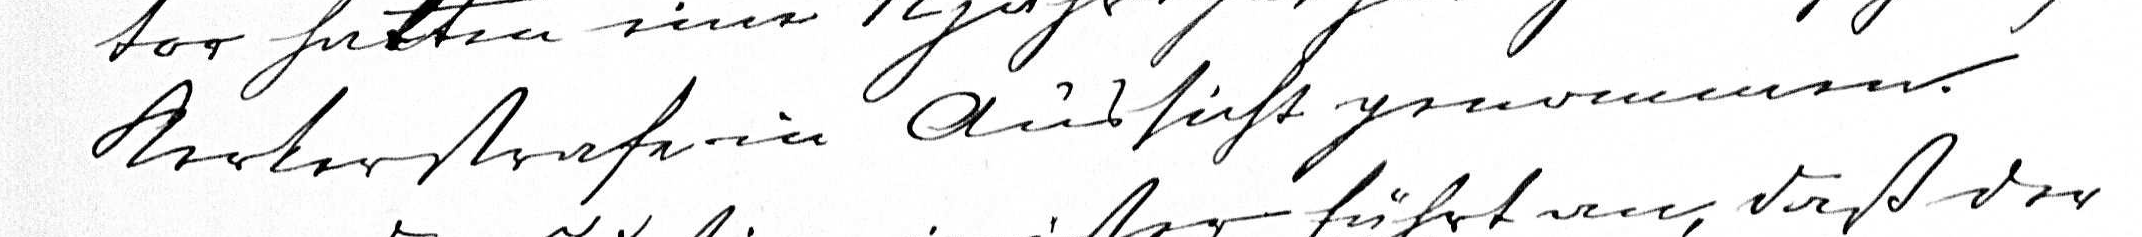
Kerkerstrafe in Aussicht genommen.
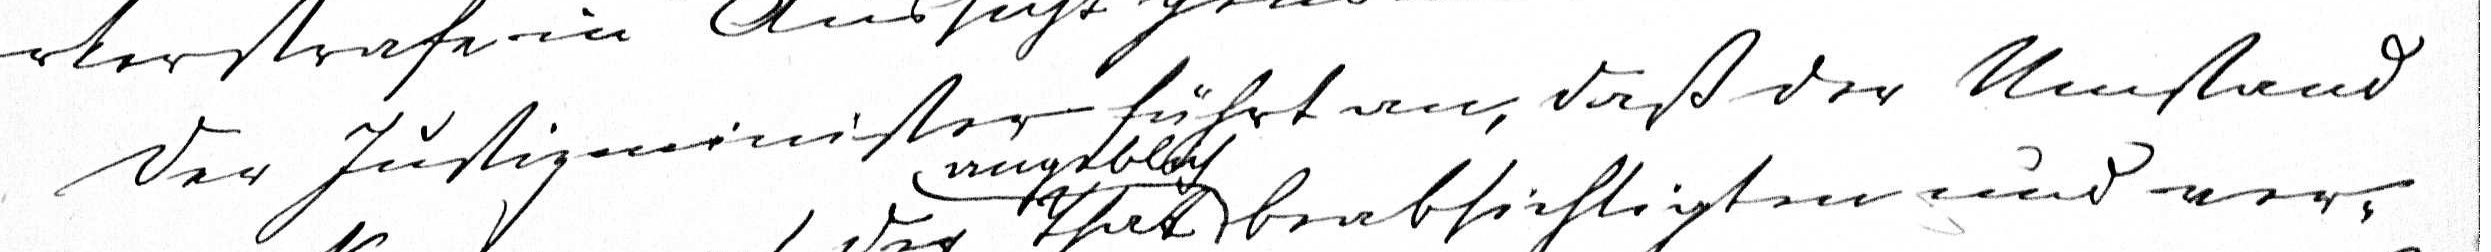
Der Justizminister führt an, daß der Umstand
